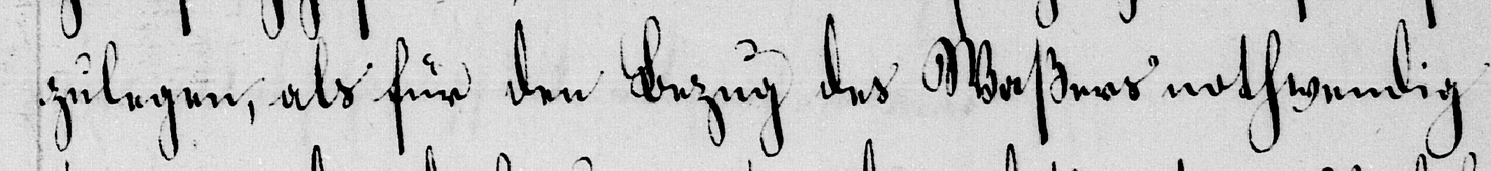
zulegen, als für den Bezug des Waßers nothwendig
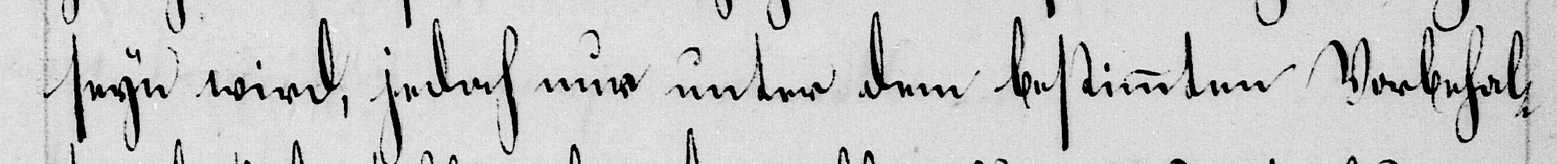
seyn wird, jedoch nur unter dem bestimmten Vorbehal¬
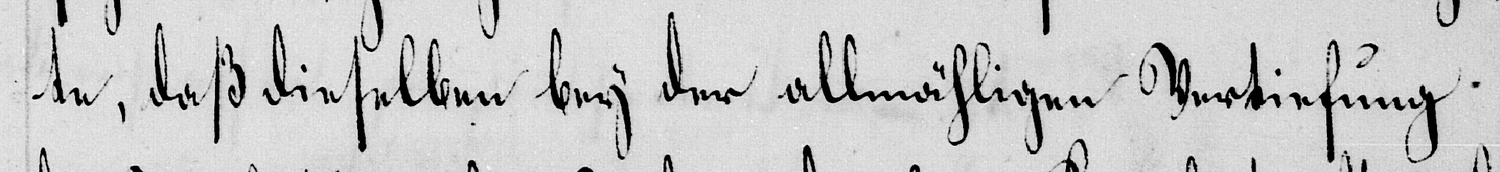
te, daß dieselben bey der allmähligen Vertiefung
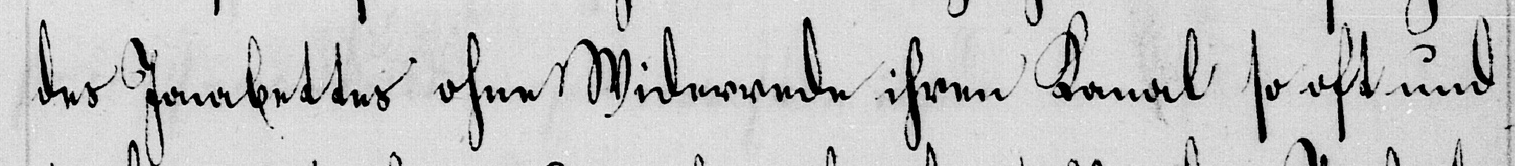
des Jonabettes ohne Widerrede ihren Kanal so oft und
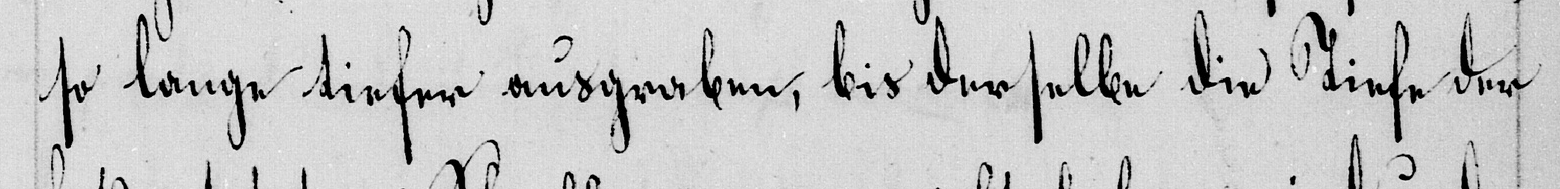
so lange tiefer ausgraben, bis derselbe die Tiefe der
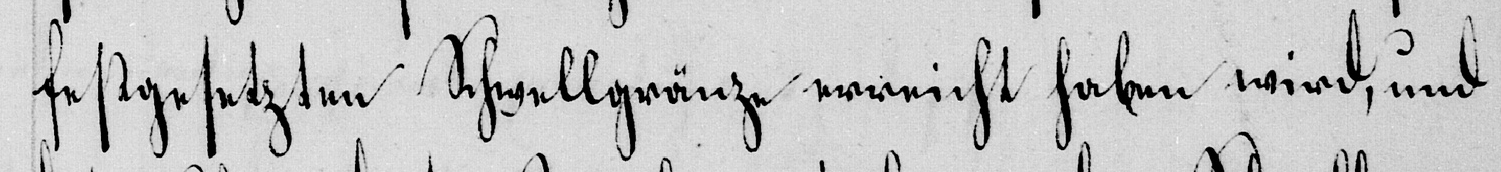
festgesetzten Schwellgränze erreicht haben wird, und
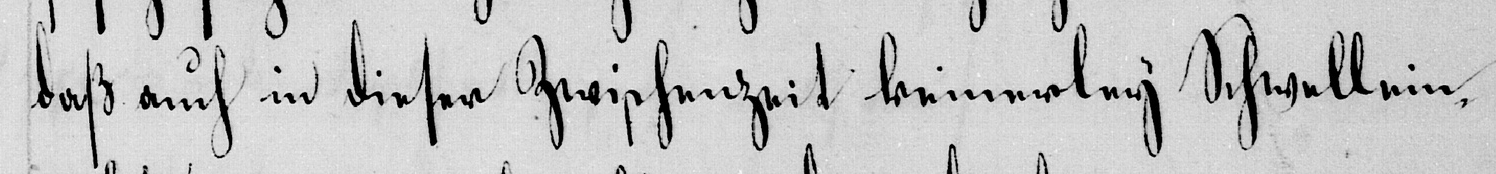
daß auch in dieser Zwischenzeit keinerley Schwellein¬
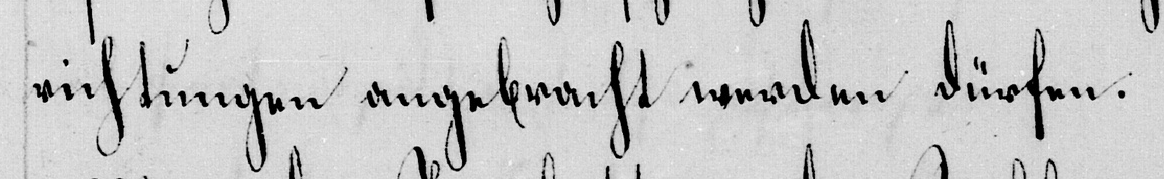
richtungen angebracht werden dürfen.
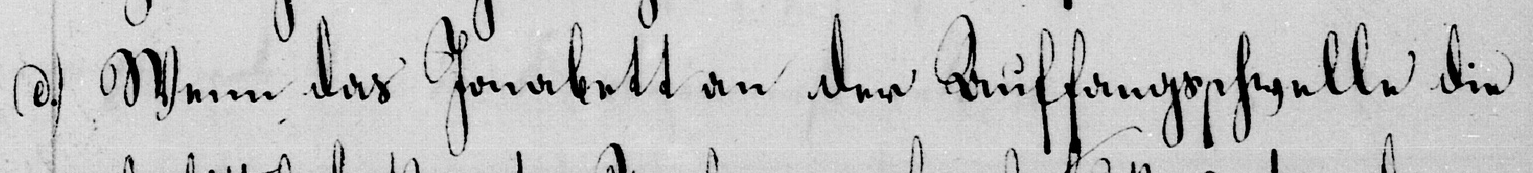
d.) Wenn das Jonabett an der Auffangsschwelle die
